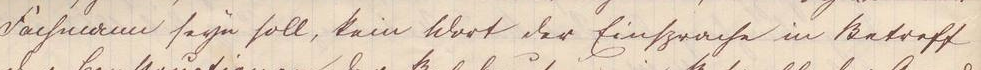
Fachmann seyn soll, kein Wort der Einsprache in Betreff
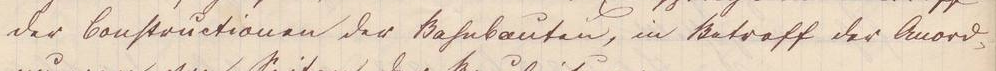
der Constructionen der Bahnbauten, in Betreff der Anord-
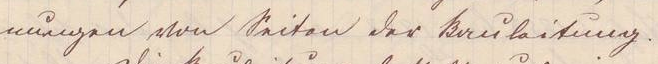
nungen von Seiten der Bauleitung.
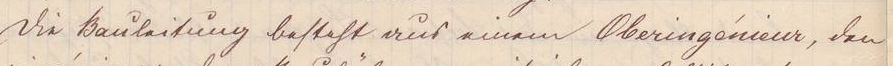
Die Bauleitung besteht aus einem Oberingénieur, den
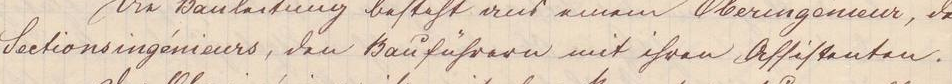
Sectionsingénieurs, den Bauführern mit ihren Assistenten.
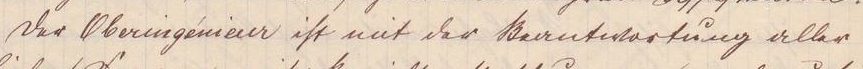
Der Oberingénieur ist mit der Beantwortung aller
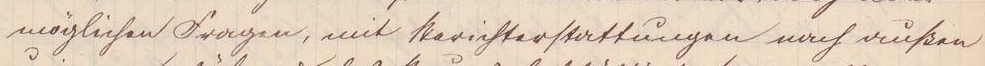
möglichen Fragen, mit Berichterstattungen nach außen
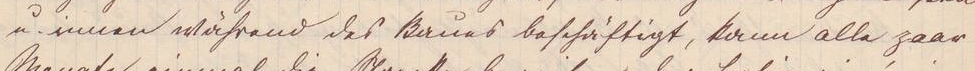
u. innen während des Baues beschäftigt, kann alle paar
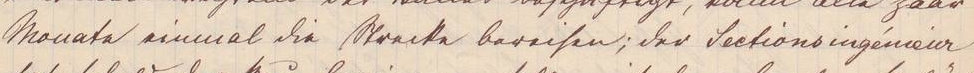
Monate einmal die Strecke bereisen; der Sectionsingénieur
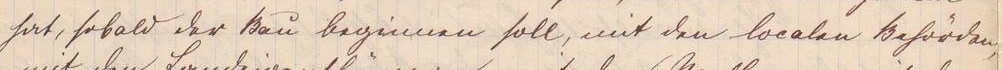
hat, sobald der Bau beginnen soll, mit den localen Behörden,
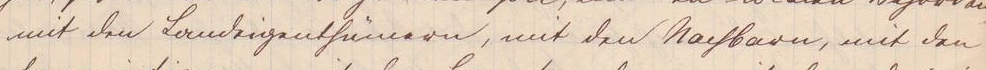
mit den Landeigenthümern, mit den Nachbarn, mit den
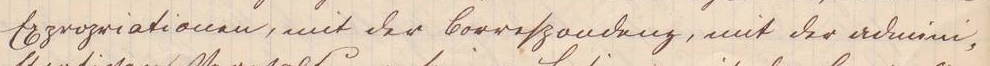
Expropriationen, mit der Correspondenz, mit der admini-
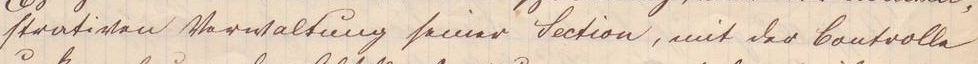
strativen Verwaltung seiner Section, mit der Controlle
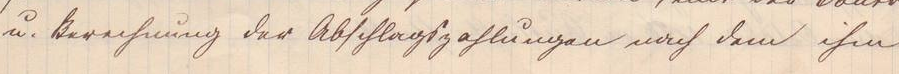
u. Berechnung der Abschlagszahlungen nach dem ihm
